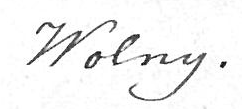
Wolny.
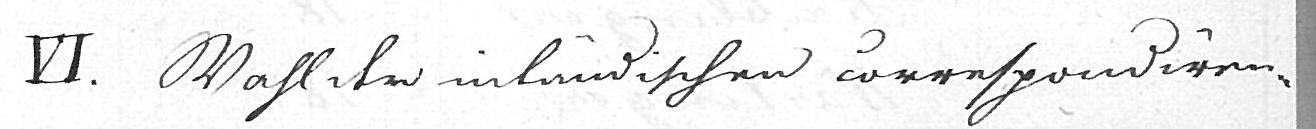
VI. Wahl der inländischen correspondiren-
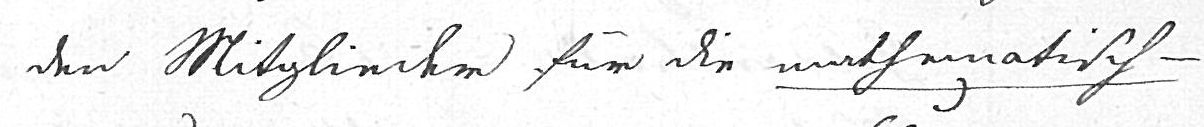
den Mitglieder für die mathematisch-
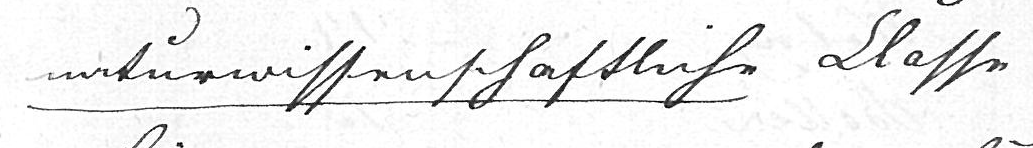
naturwissenschaftliche Classe.
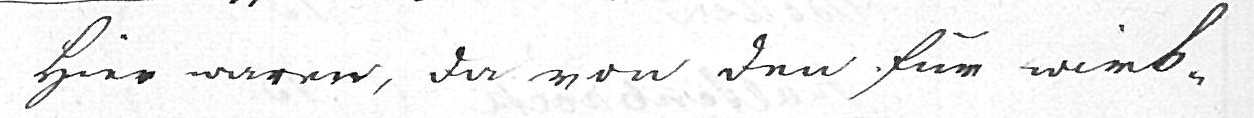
Hier waren, da von den für wirk-
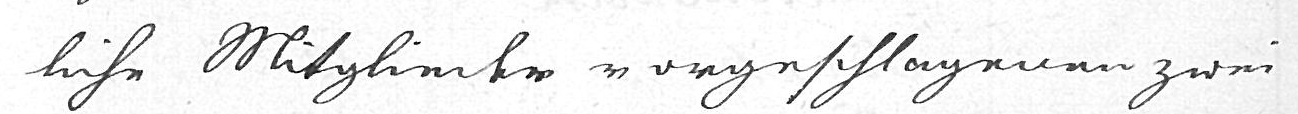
lichen Mitglieder vorgeschlagenen zwei
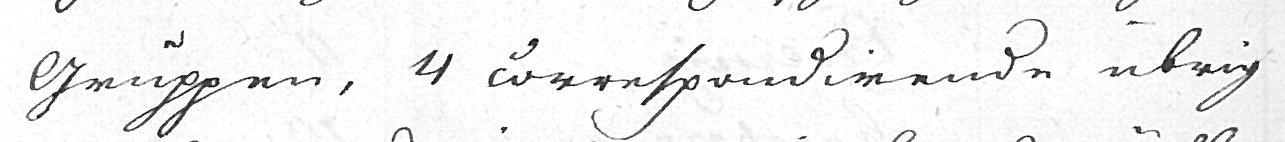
Gruppen, 4 correspondirende übrig
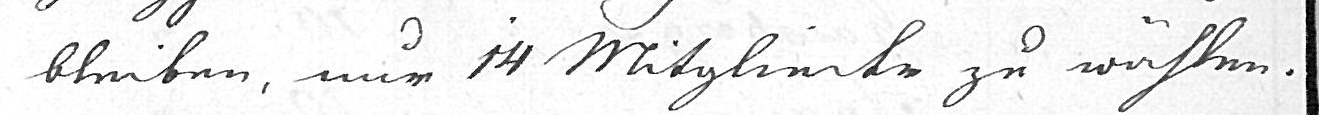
bleiben, nur 14 Mitglieder zu wählen.
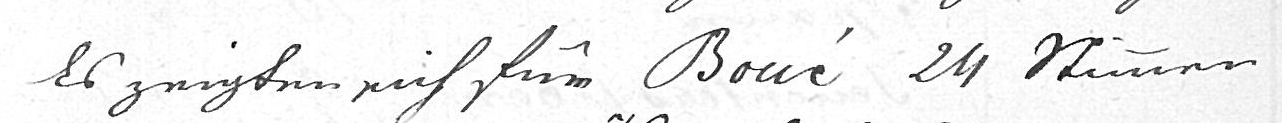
Es zeigten sich für Boué 24 Stimmen.
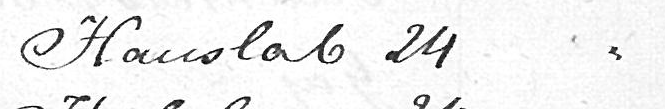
Hauslab 24 "
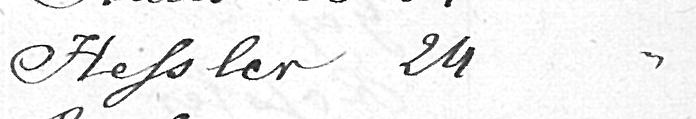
Hessler 24 "
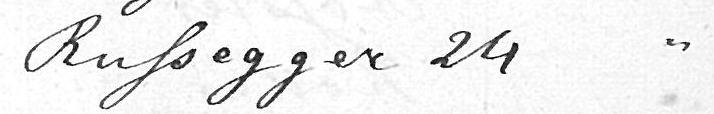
Russegger 24 "
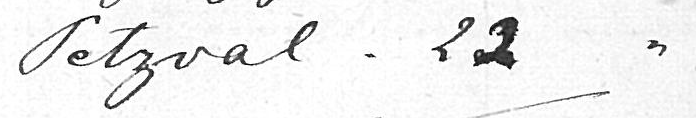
Petzval . 22 "
